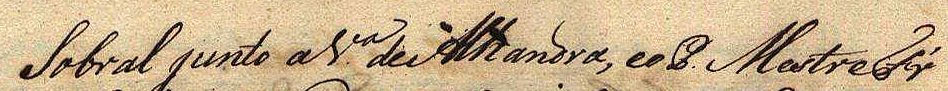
Sobral junto a V.a de Alhandra, e o P. Mestre Fr̄
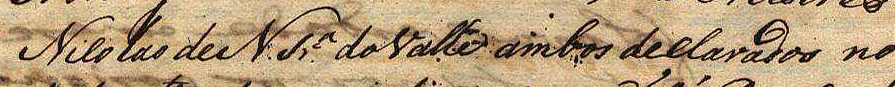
Nicolao de N. sr.a da Valle ambos declarados no
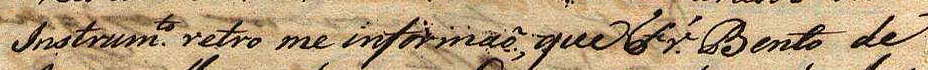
Instrum.to retro me informaõ; que Fr̄. Bento de
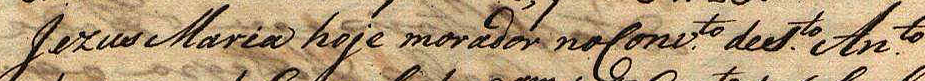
Jezus Maria hoje morador no Conv.to de S.to An.to
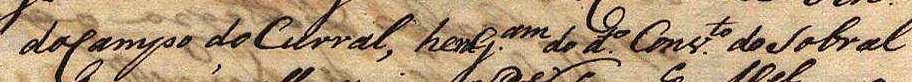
do Campo do Curral, hera G.am do d̄.o Conv.to do Sobral
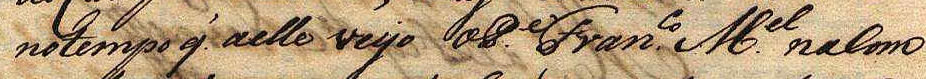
no tempo q̄ a elle veyo o P.e Fran.co M.el na Com
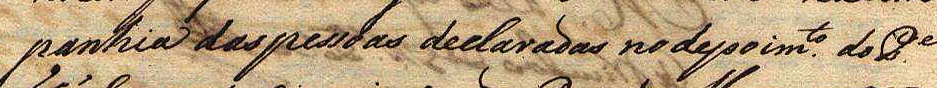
panhia das pessoas declaradas no depoim.to do P.e
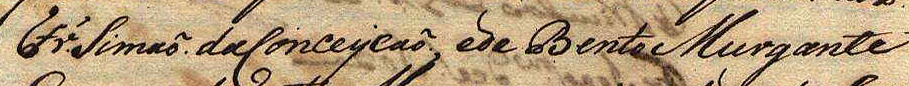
Fr̄ Simaõ da Conceyçaõ, e de Bento Murgante
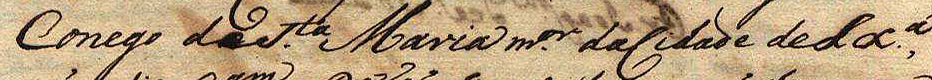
Conego da S.ta Maria m.or da Cidade de Lx.a,
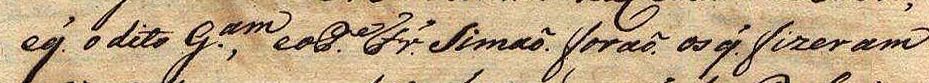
e q̄ o dito G.am, e o P.e Fr̄. Simaõ foraõ os q̄ fizeram
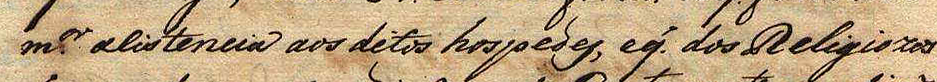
m.or acistencia aos ditos hospedes, e q̄ dos Religiozos
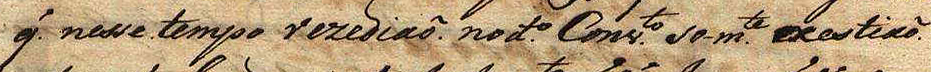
q̄ nesse tempo rezediaõ no d̄.o Conv.to som.te exestiaõ.
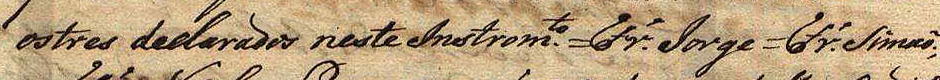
os tres declarados neste Instrom.to = Fr̄. Iorge = Fr̄. Simaõ;
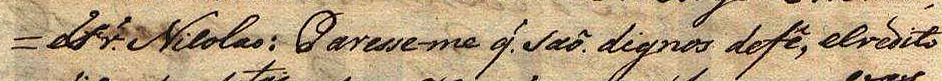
= Fr̄. Nicolao: Paresse-me q̄ saõ dignos de fé, e Credito
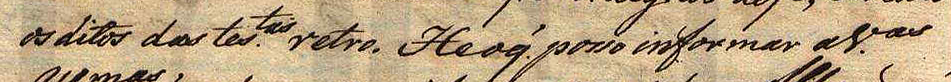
os ditos das tes.tas retro. He o q̄ posso informar a V.as
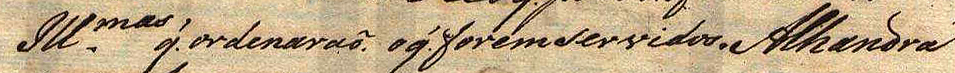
Ill.mas q̄ ordenaraõ o q̄ forem servidos. Alhandra
